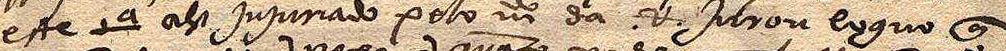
este ta asi Jnjuriado pelo mdo da R Jurou loguo q̄
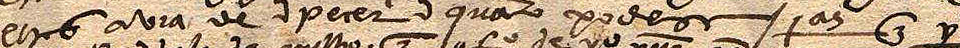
lhes avia de ēpecer ē quāto podese / tas item ꝑo
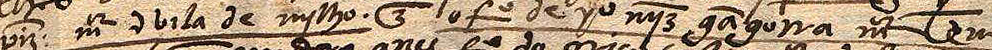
pīz mor ē vila de mjlho. item o fo de yo mj̄z gāgorra mor em
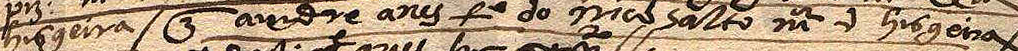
hisgeira / item amdre anes fo do rrico salto mor ē hisgeira/
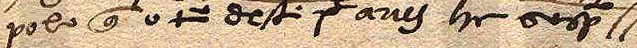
polo q̄ o to deste pe anes he sospto //
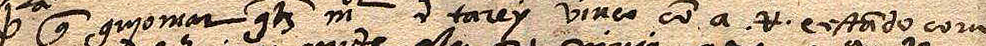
Pra q̄ gujomar ḡlz mor ē tarey viueo cō a R e estādo com
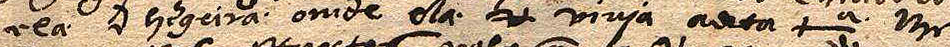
ela ē hesgeira omde ela R viuja a dita ta lhe
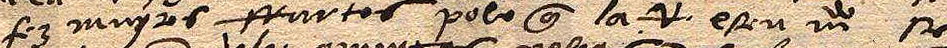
fez muytos ffurtos polo q̄ a R e seu mdo se
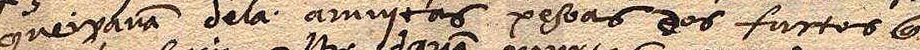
queixauā dela a mujtas pesoas dos furtos q̄
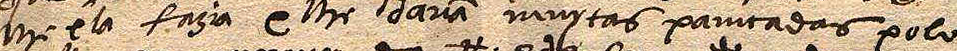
lhe ela fazia e lhe dauā muytas pamcadas polo
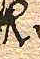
R
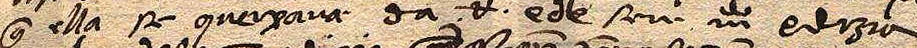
q̄ ella se queixaua da R e de seu mdo e dizia
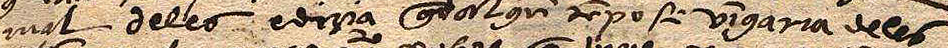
maL deles e dizia q̄ ē algū tēpo se vīgaria deles
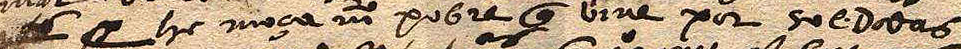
e he moça mto pobre q̄ viue por soldadas
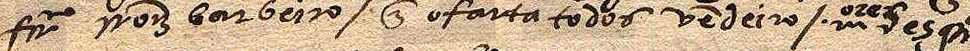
frrco rrōiz barbeiro / item o farta todos vēdeiro / mores ē esgra
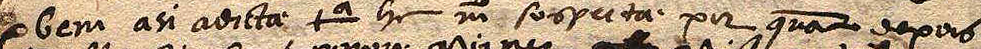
e bem asi a dcta ta he mto sospeita porqūato depois
